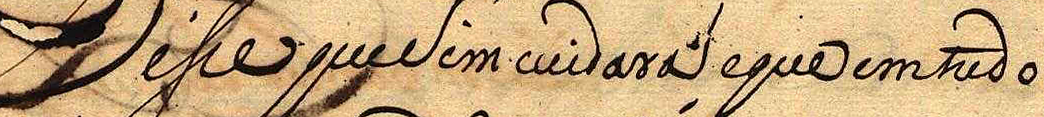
Disse que Sim cuidara, e que em tudo
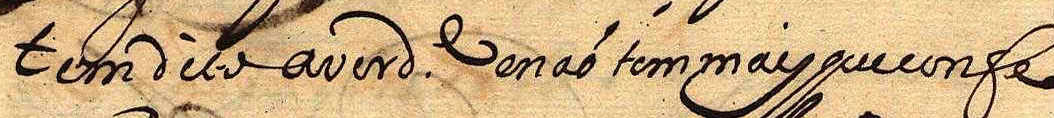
tem dito a verd.e e naõ tem mais que confe
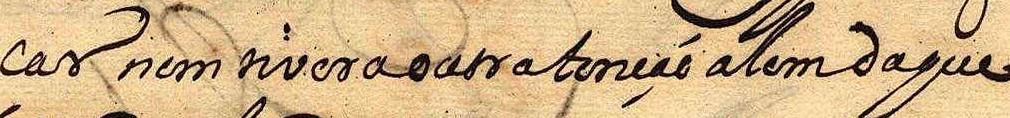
çar nem tivera outra tençaõ além da que
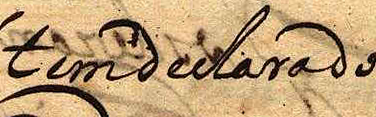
tem declarado
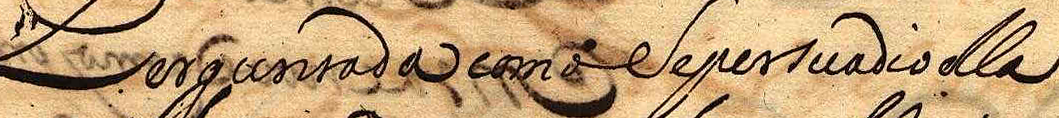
Perguntada como Se persuadiu ella
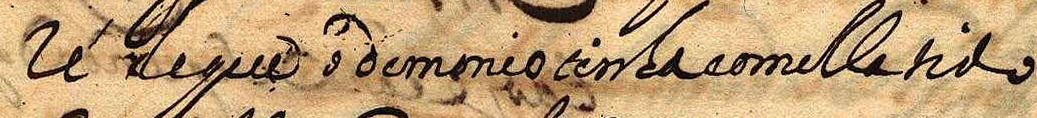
Ré de que o demonio tinha com ella tido
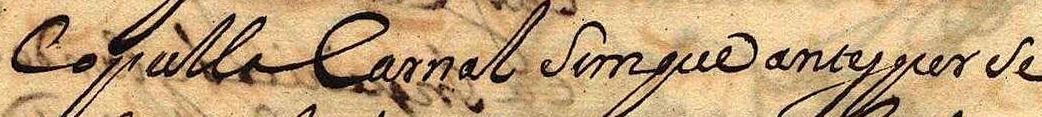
Copulla Carnal Sem que antes per se
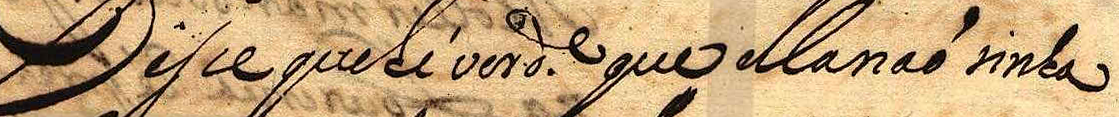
Disse que hé verd.e que ella naõ tinha
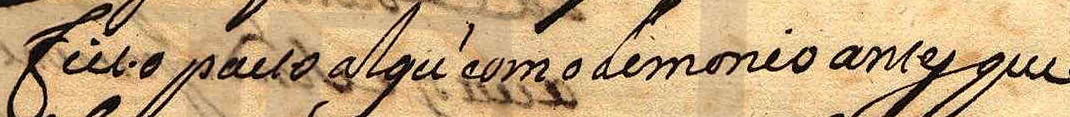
feito pacto algū com o demonio antes que
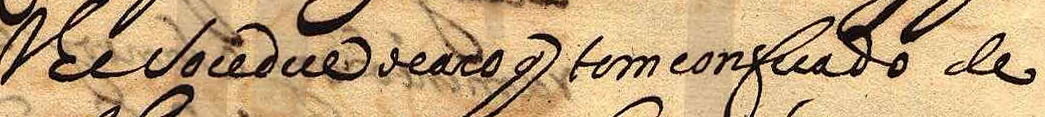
lhe Socedece o cazo q̄ tem confeçado de
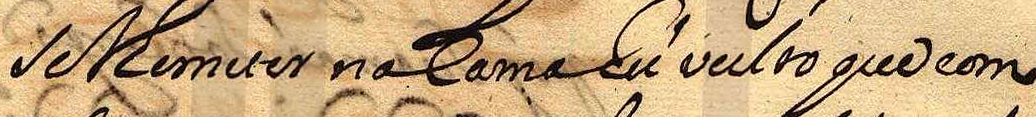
se lhe meter na Cama hū vulto que com
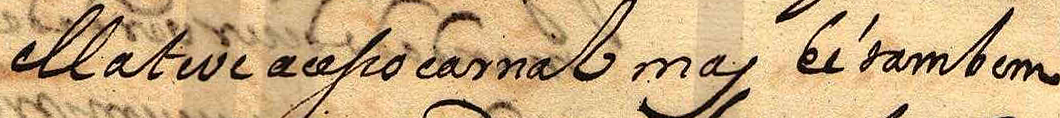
ella teve acesso carnal mas hé tambem
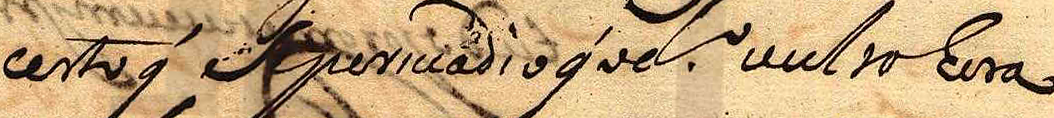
certo q̄ Se persuadio q̄ o d.o uulto hera
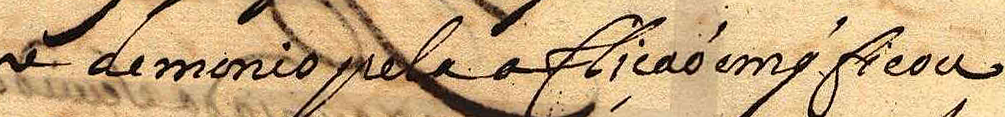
o demonio pela afliçaõ em q̄ ficou
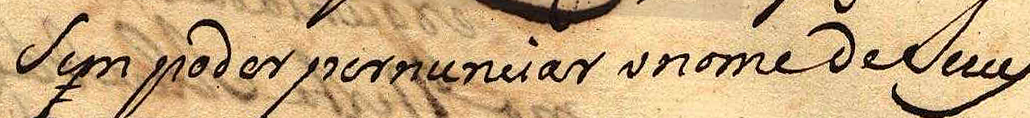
Sem poder pernunciar o nome de Iesus
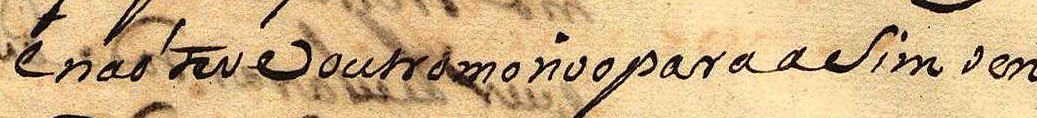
e naõ teve outro motivo para aSim o en
